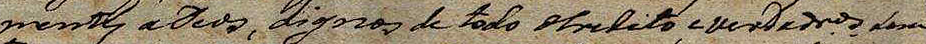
mentes a Deos, dignos de todo o Credito, e verdadr.os sem
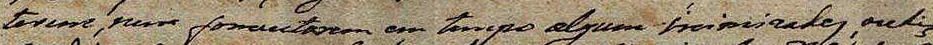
terem, nem fomentarem em tempo algum inimizades, ou diz
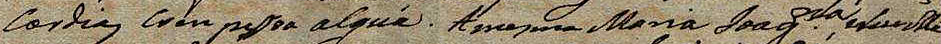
cordias com pessoa alguā. A mesma Maria Joaq.na, e seu Ma
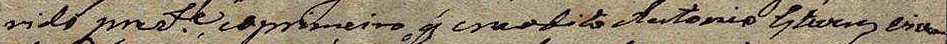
rido prezt.e, e o primeiro, q̄ era o dito Antonio Estevens viv
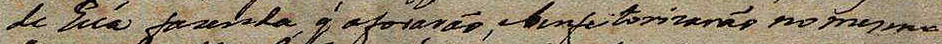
de huā fazenda, q̄ aforarão, e benfeitorizarão no mesmo
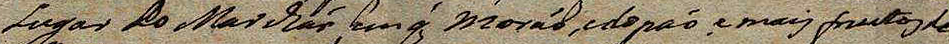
Lugar do Marchaõ, em q̄ morão, e do paõ, e mais fructos de
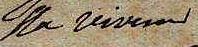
lla vivem.
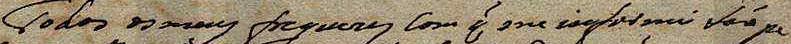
Todos os meus freguezes, com q̄ me informei saõ pe
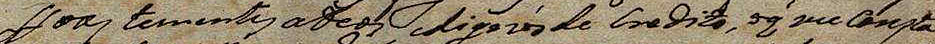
ssoas tementes a deos, e dignos de credito, o q̄ me consta
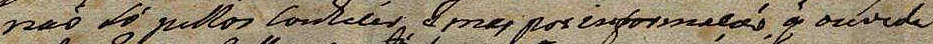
naõ só pellos conhecer, e mas por informaçaõ, q̄ ouvi de
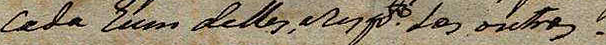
cada hum delles, a Resp.to dos outros.
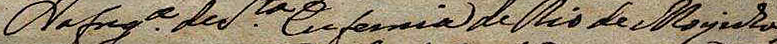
Na freg.a de S.ta Eufemia de Rio de Moynhos
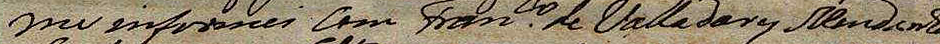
me informei com Fran.co de Valladares Mendenha
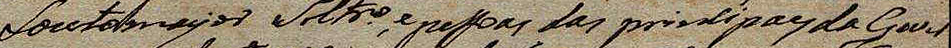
Soutomayor soltr.o, e pessoas das principaes da Gover
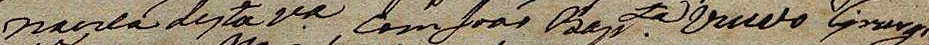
nanca desta V.a, com Joaõ Bap.ta veuvo Cjrurgi
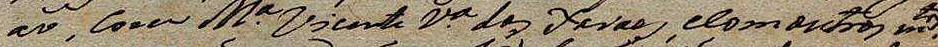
aõ, com M.a Vicente V.a dos Xaraes, e com outros m.tos,
